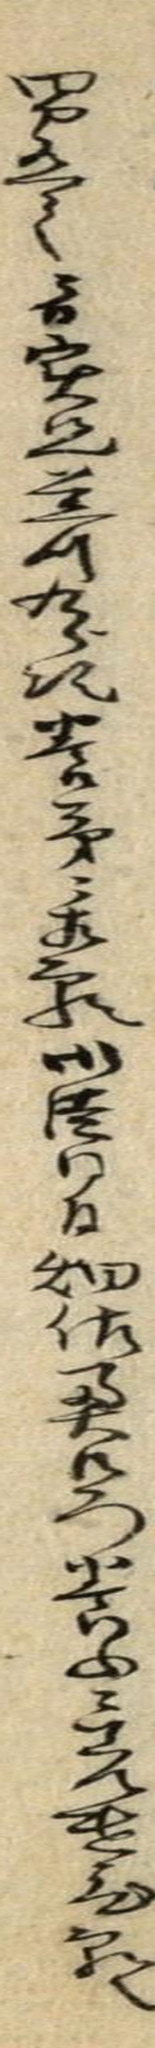男有之ニ付実兄荒川九郎次養弟ニ相願御徒目付畑佐奥左衛門養子ニ差遣度願之
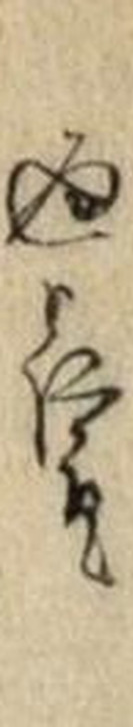通被仰付候
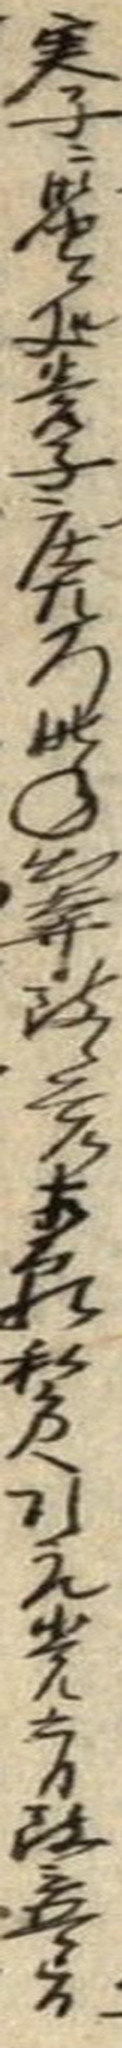実子ニ御座候処養子庄左衛門昨年出奔致候節相願私方へ引取養育致置候旨
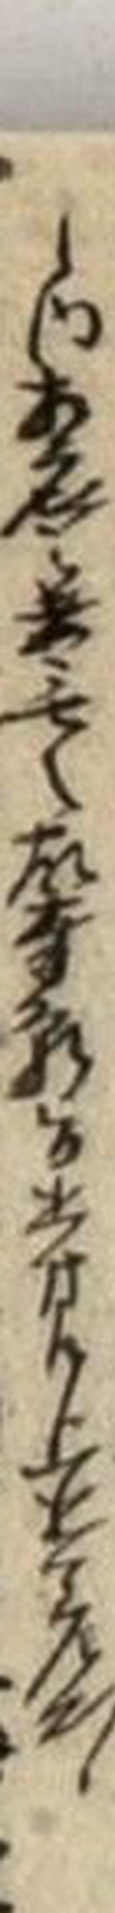之内相応之者無之故奉願旨書付口上書差出候
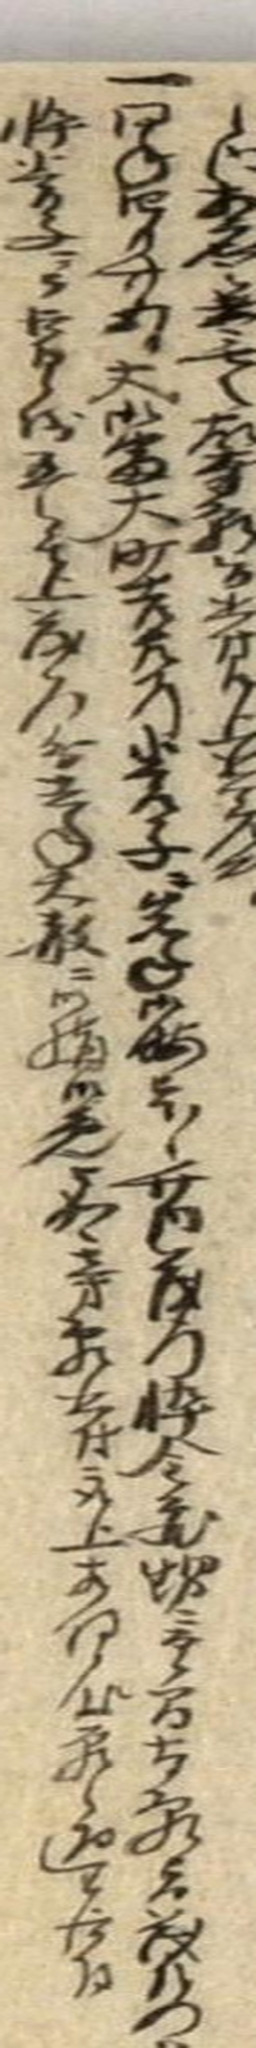忰養子ニ被仰付候儀有之其上茂左衛門義去年大赦ニ御構御免被成候傍願書付取上相伺候処願之通被仰付

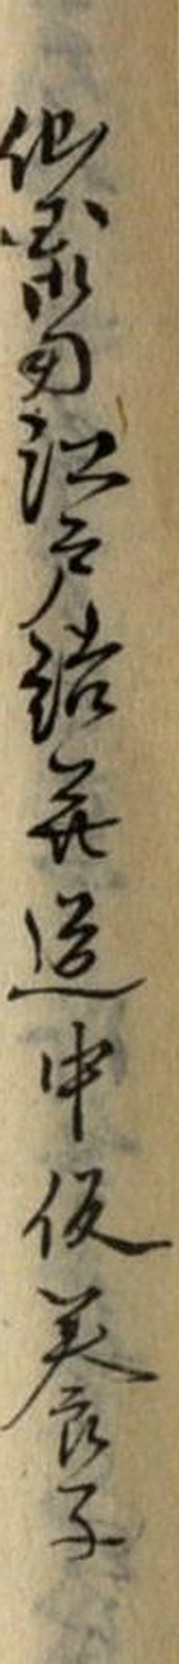他国御用江戸詰幷道中仮養子
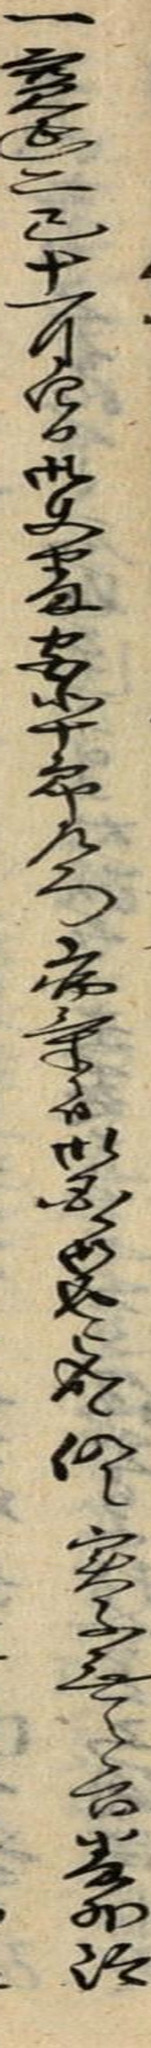一寛延ニ巳十一月四日御使番宮北十郎左衛門病気二付御国へ御返被成候仍之実子無之候間番外鈴
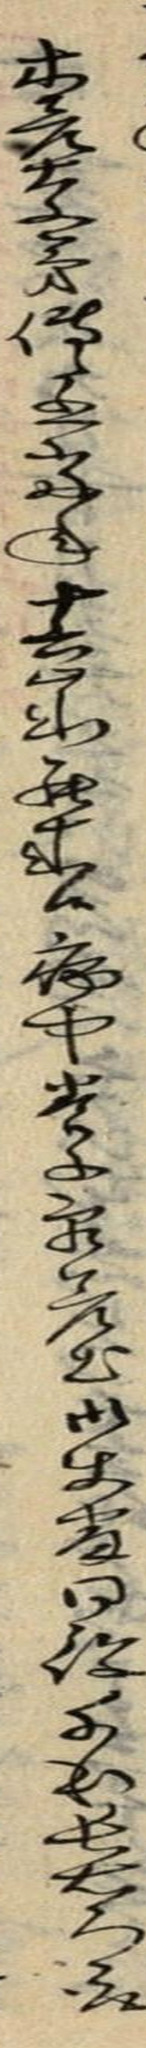木彦大夫弟伝之丞当年十六歳罷成処候病中養子願差出御使番同役千本長右衛門取
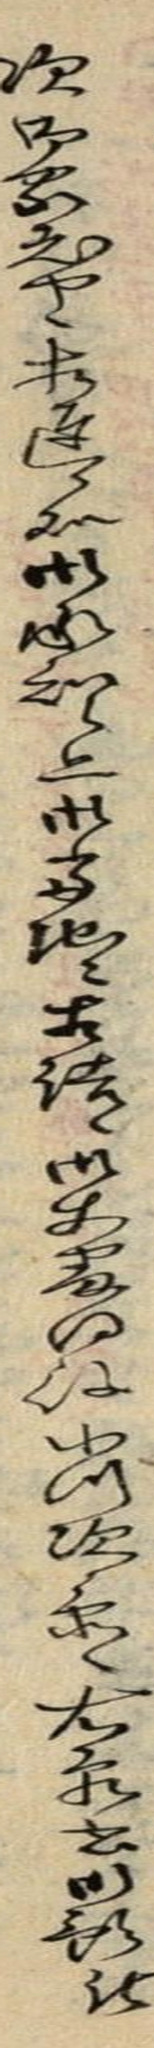次御家老中へ相達候処御承知之上御当地ニ相詰候御使番同役小川次兵衛へ右願書御預被
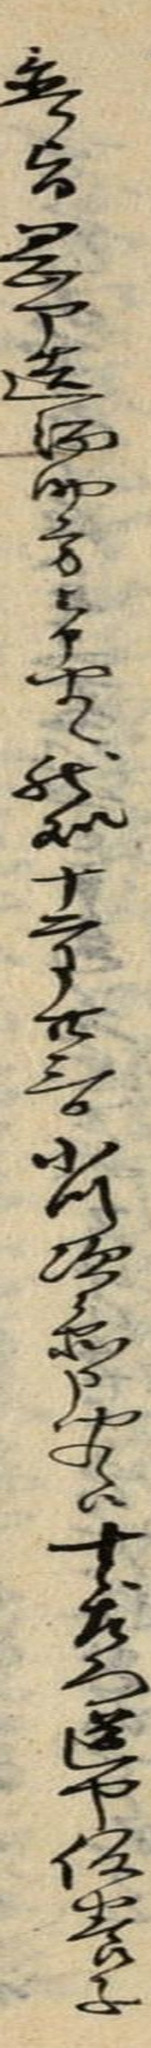置候旨岡部造酒助方被申聞候然処十二月廿三日小川次兵衛申聞候ハ十郎左衛門道中仮養子由
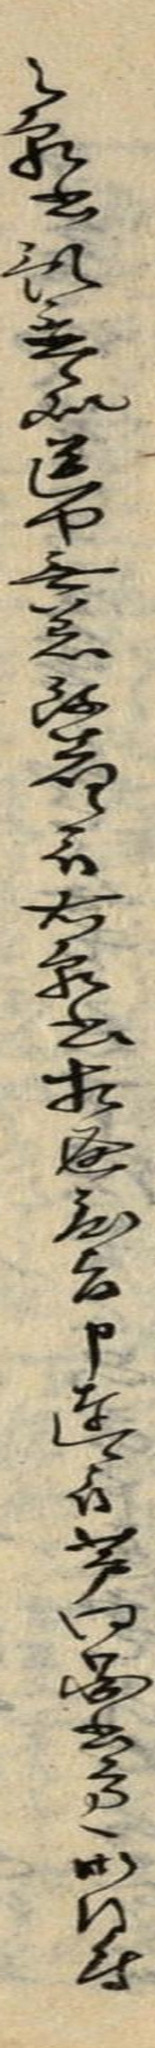之願書預置候処道中無恙致着候二付右願書相返度旨申達候ニ付芦田図書方へ御目付
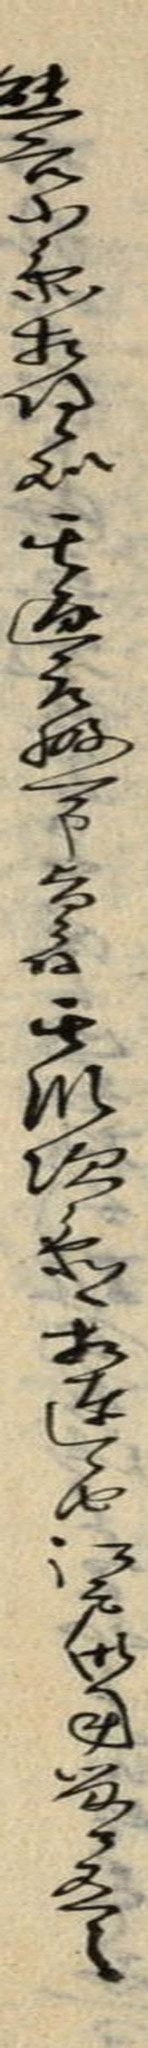熊谷小兵衛相伺候処其通取扱可申旨二付其段次兵衛へ相達候由江戸御用留ニ有之
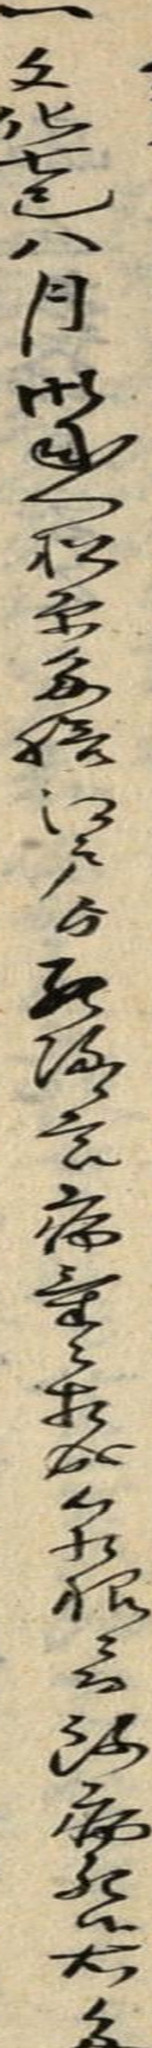一文化七巳八月御用人松原多膳江戸ゟ罷帰候節病気二相成箱根二而致病死候右多
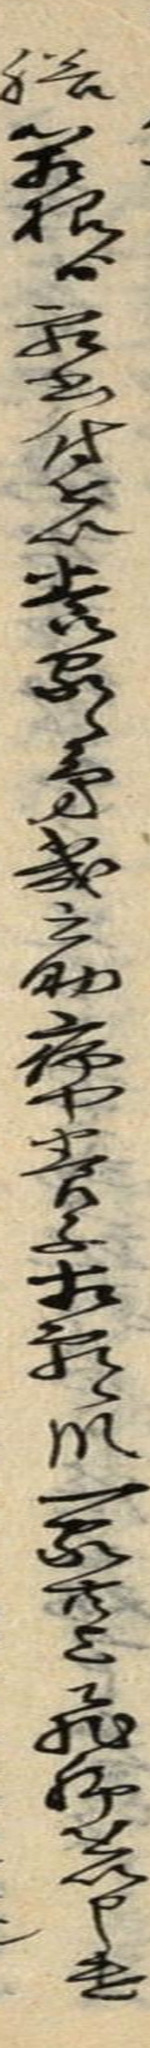膳箱根ゟ願書付を以養家之弟幾之助病中養子相願候段一家共迄飛脚を以申遣
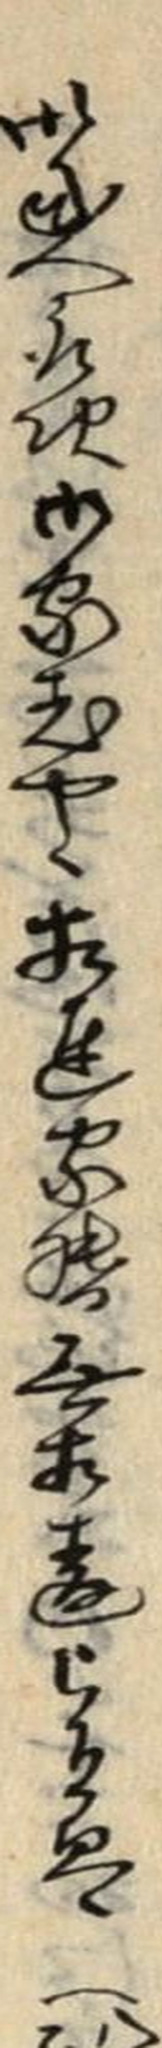御用人取次御家老中へ相達家督無相違無相違被下置候
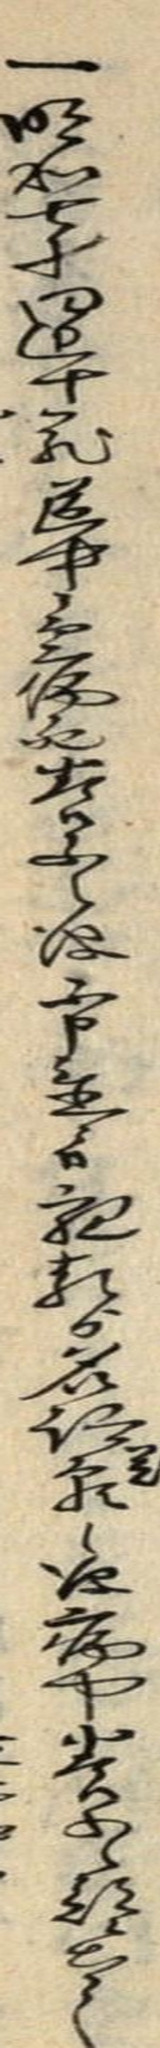一明和七刁田辺十蔵道中ニ而病死養子之儀不申置ニ付親類ゟ名跡歎願之儀病中養子之部ニ出之
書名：養子縁組之部
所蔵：福井県文書館 Fukui Prefectural Archives
